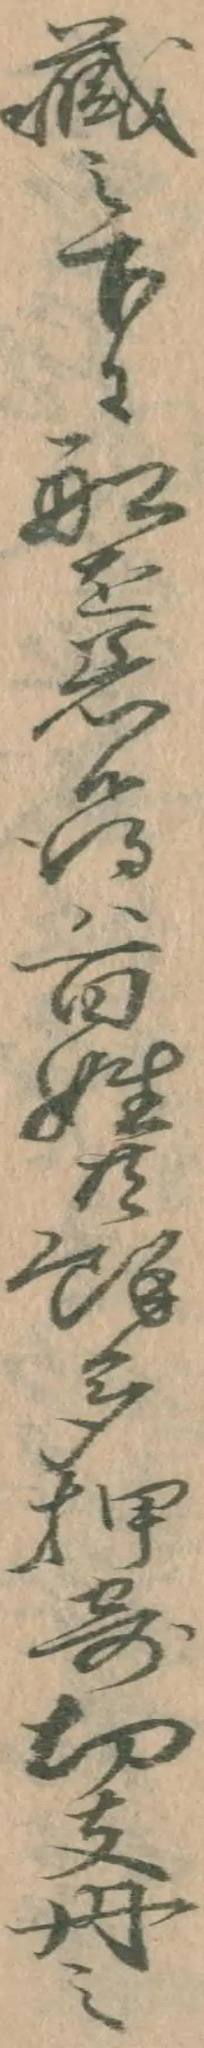蔵之下に船を着候得は百姓共余多押寄切支丹之
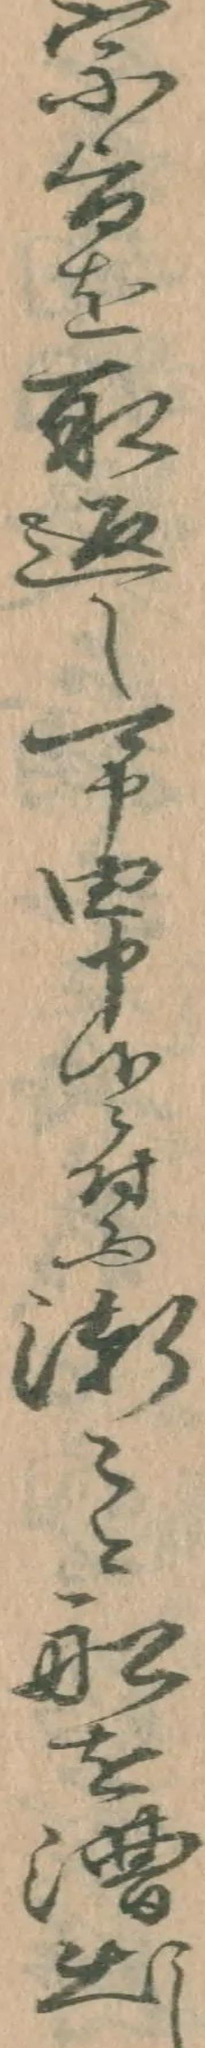宗旨を取返し可申由申候に付而漸々と船を漕出し
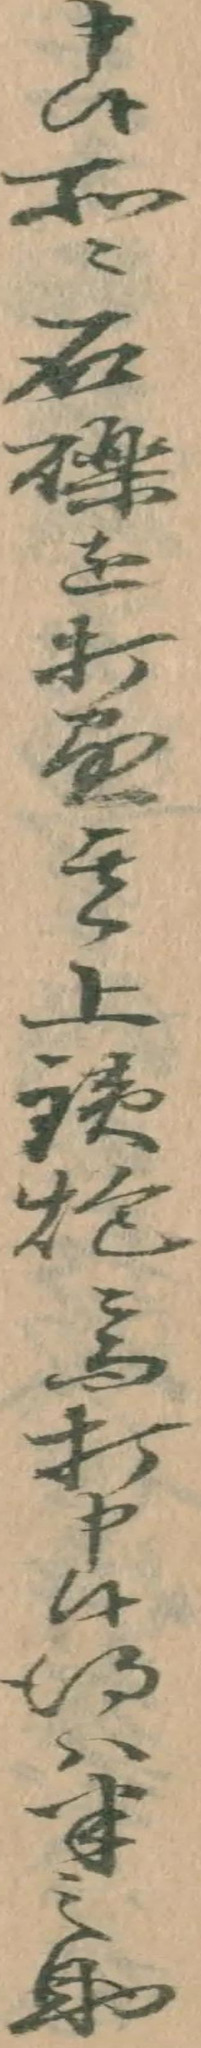申候所に石礫を打懸其上鉄炮に而打申候得は半之助
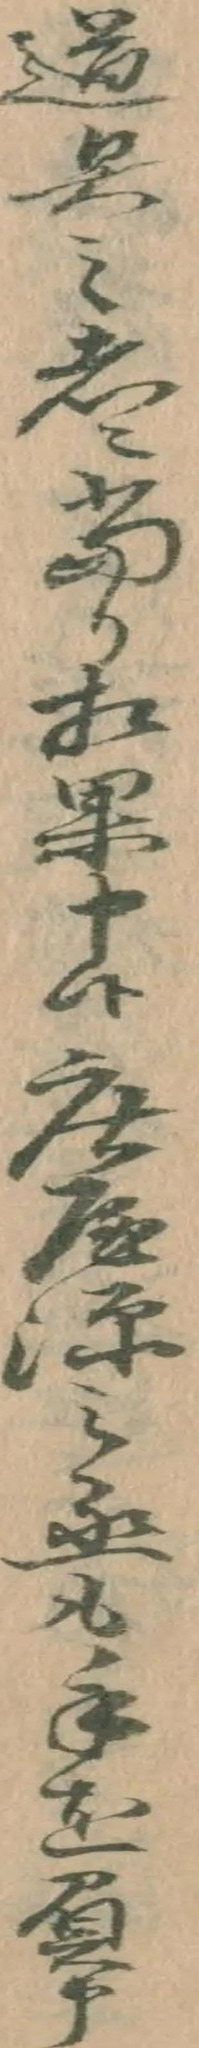道具之者に当り相果申候庄屋源之丞も手を負申
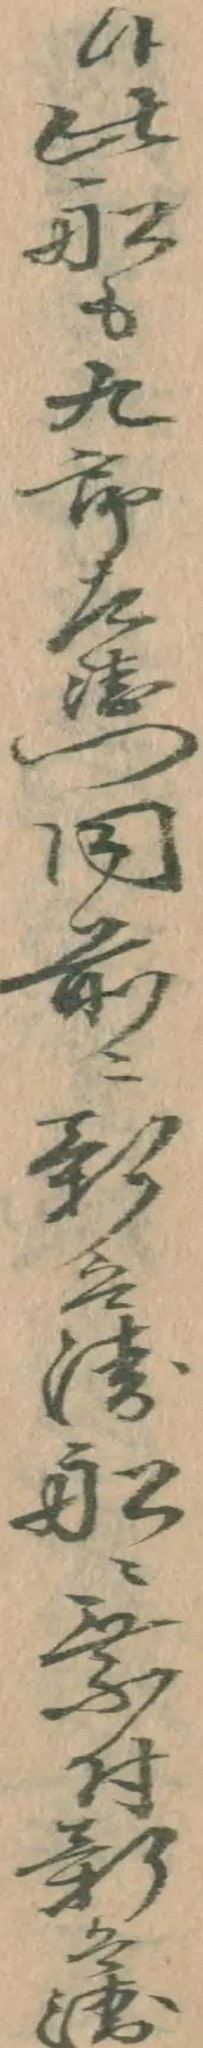候此船も九郎左衛門同前に新兵衛船に乗付新兵衛
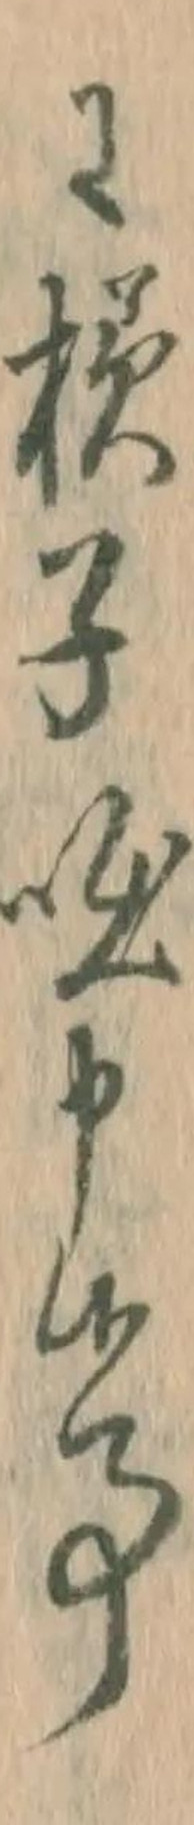に様子咄申候事
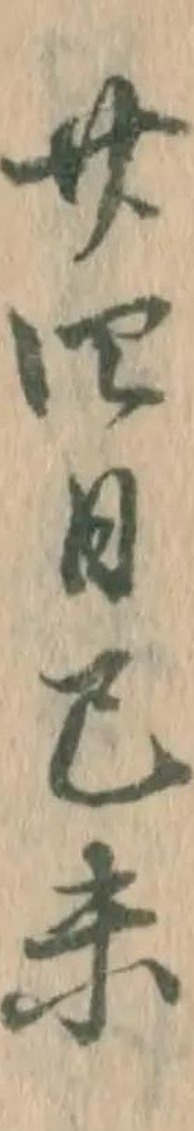廿四日己未
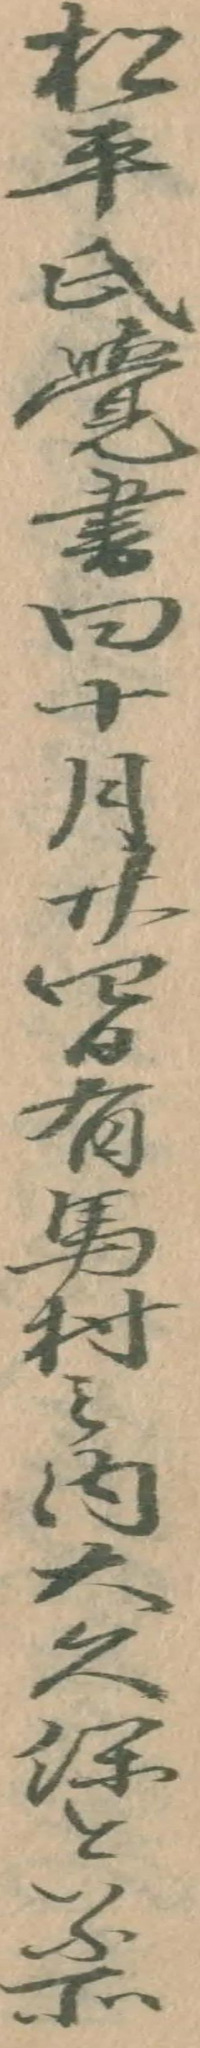松平氏覚書日十月廿四日有馬村之内大久保といふ所
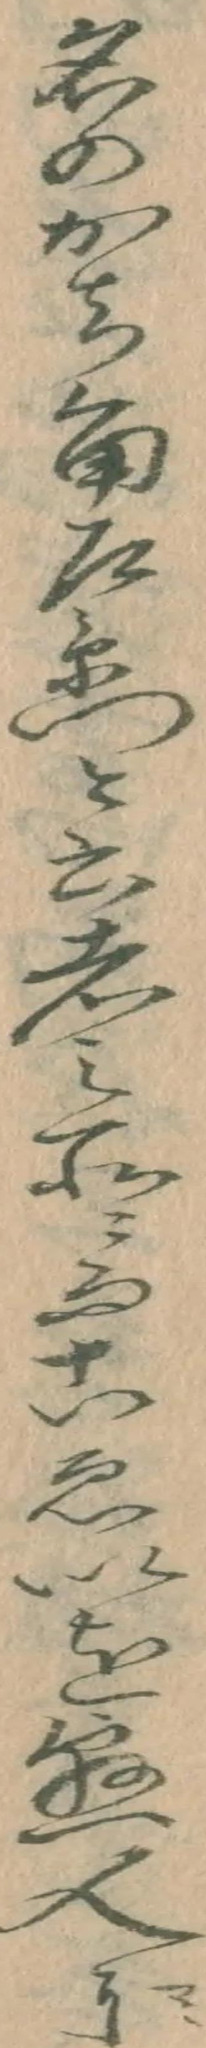名のかち角左衛門と云者之所に而こゑいを懸人に
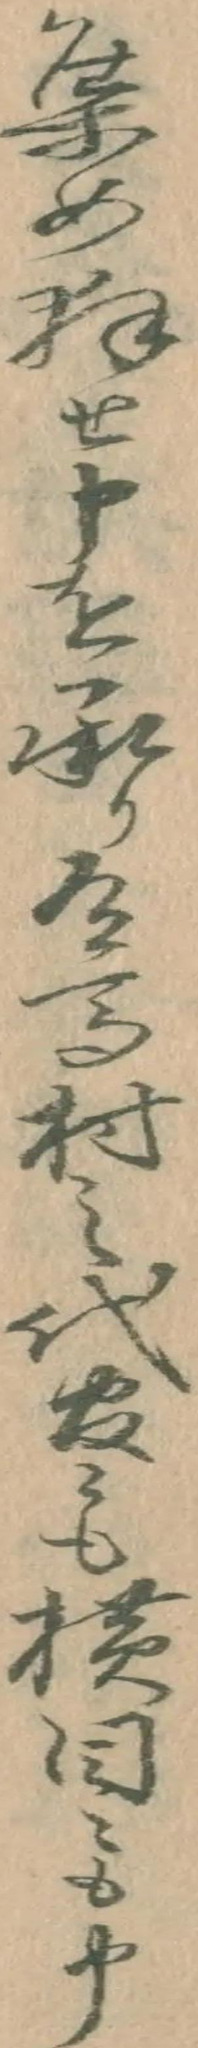集め拝せ申を承り有馬村之代官にも横目にも申
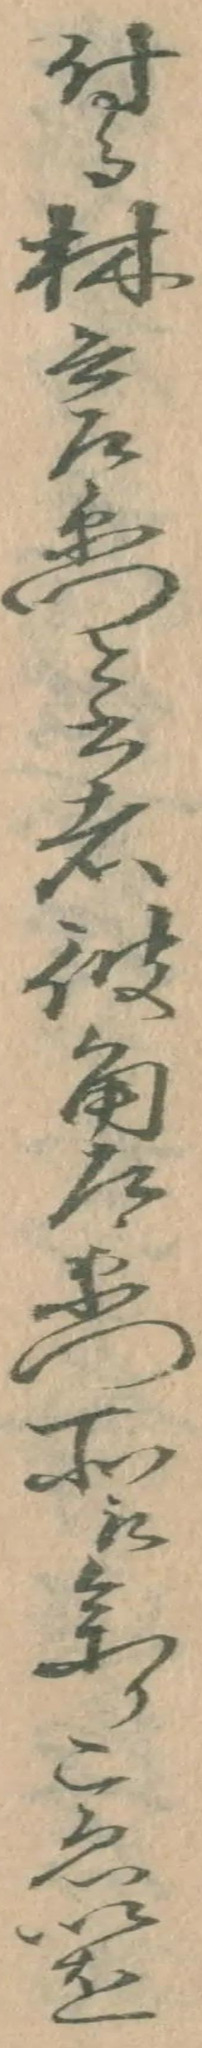付る林兵左衛門と云者彼角左衛門所え参りこゑいを

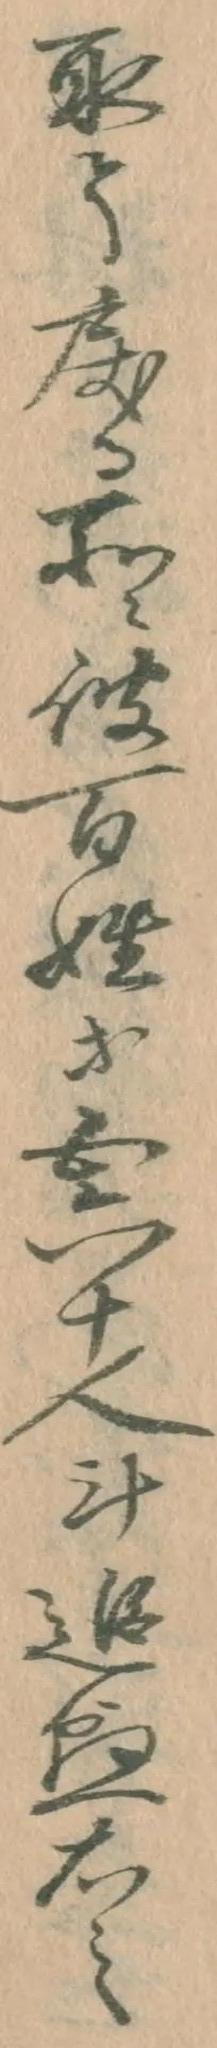取て戻る所に彼百姓等五六十人斗追懸右之
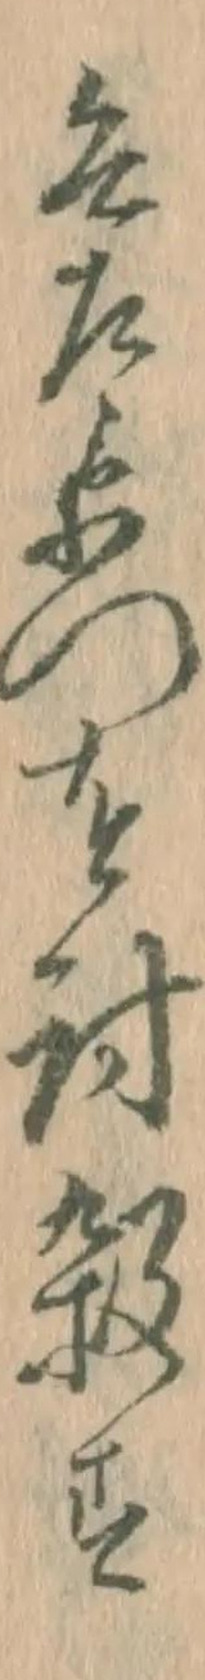兵左衛門を討殺す
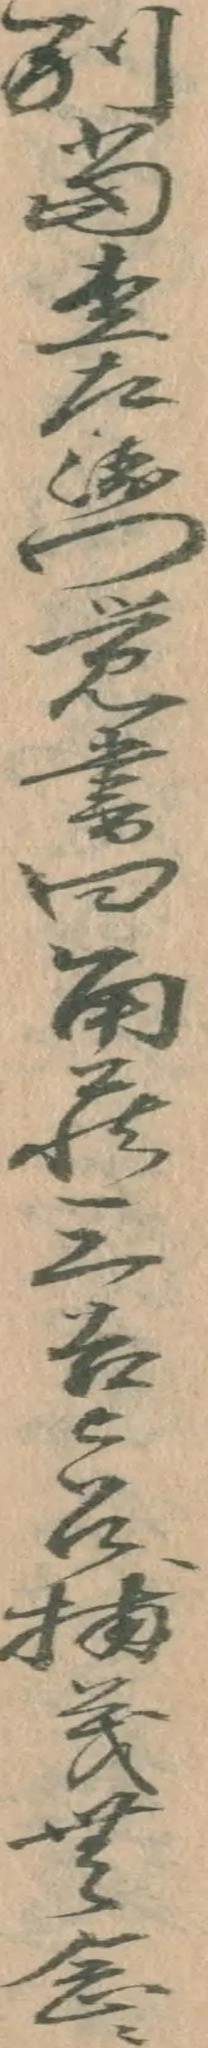別当杢左衛門覚書日角蔵三吉被召捕義無念に
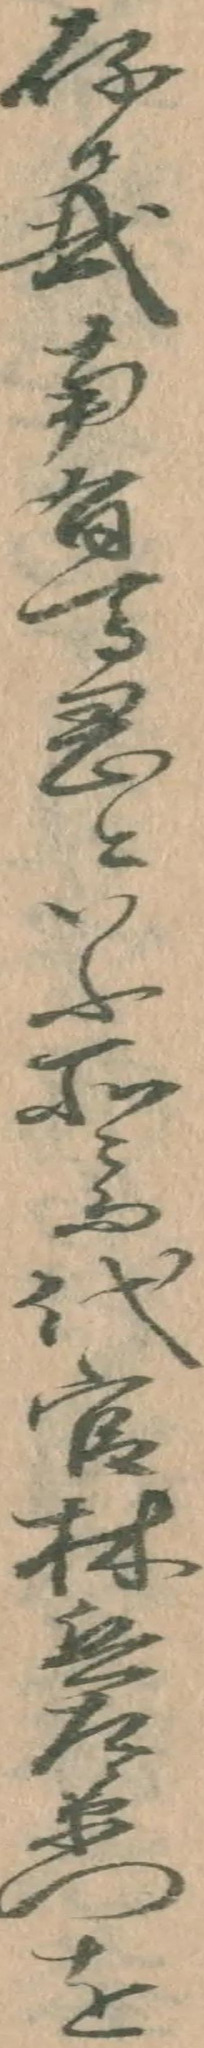存候哉南有馬岡といふ所に而代官林兵左衛門を
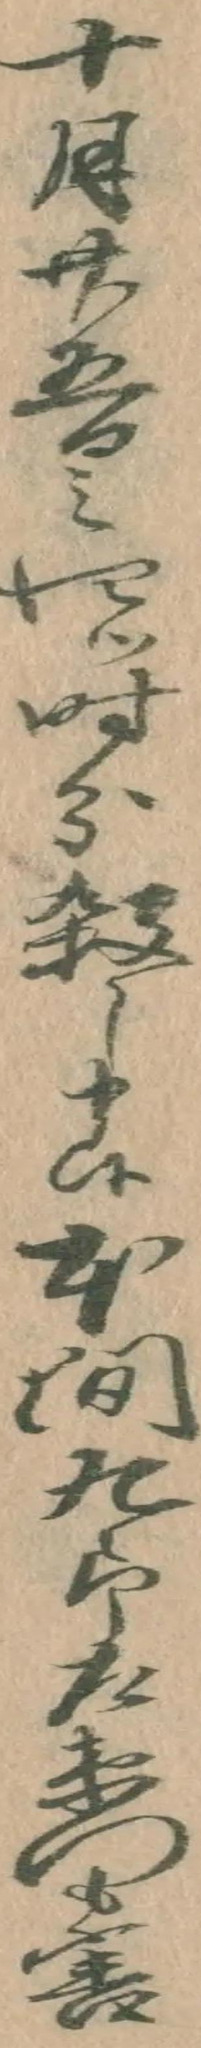十月廿五日之四ツ時分殺し申候本間九郎左衛門も害
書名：切支丹御退治記 49巻. [1]
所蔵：国立国会図書館 National Diet Library, JAPAN
